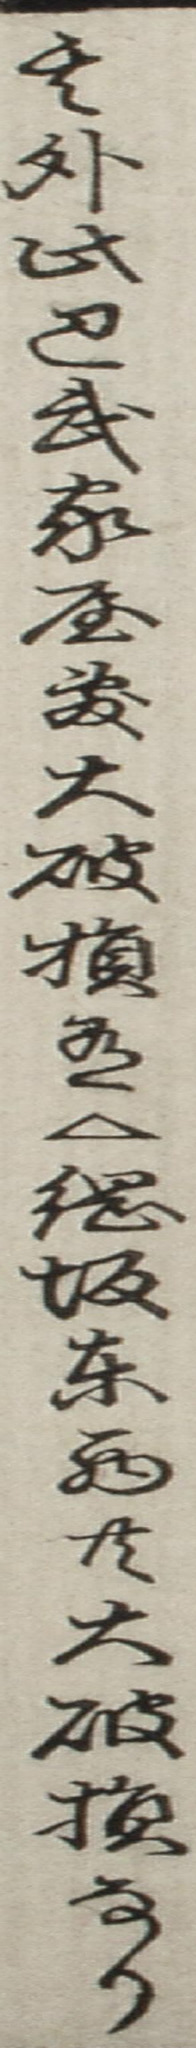其外此辺武家屋敷大破損有△綱坂東西とも大破損なり
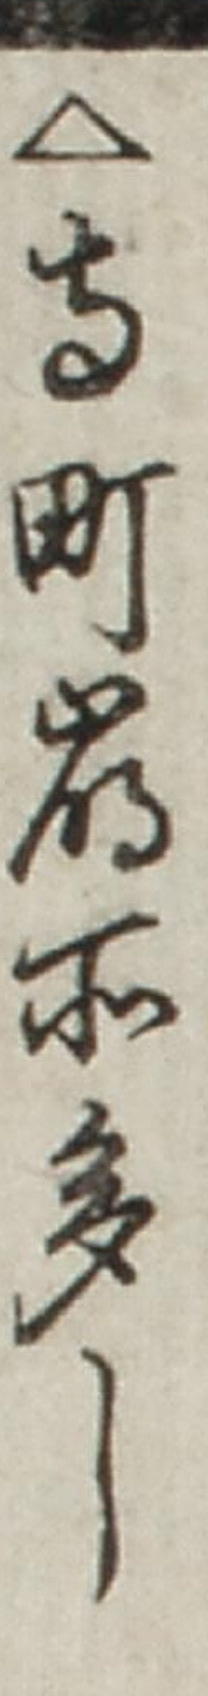△寺町崩所多し
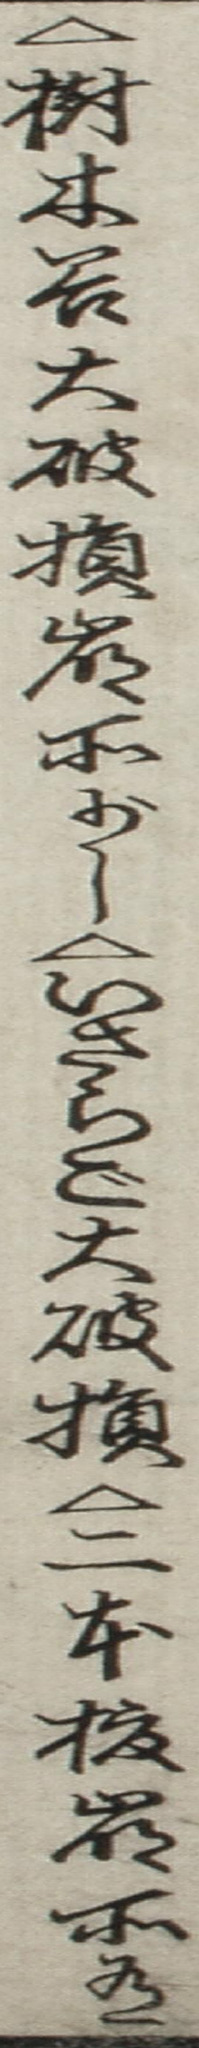△樹木谷大破損崩所少し△いさらご大破損△二本榎崩所有
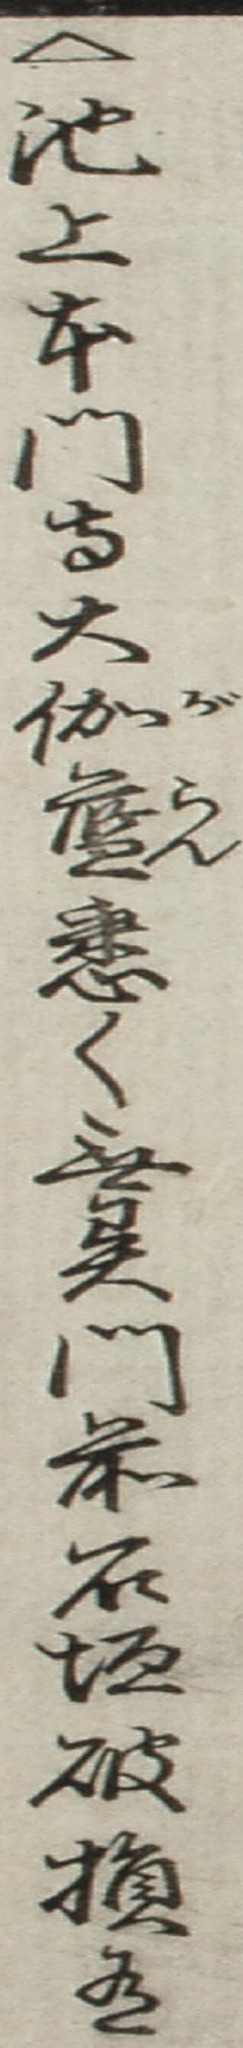△池上本門寺大伽藍悉く無異門前石垣破損有
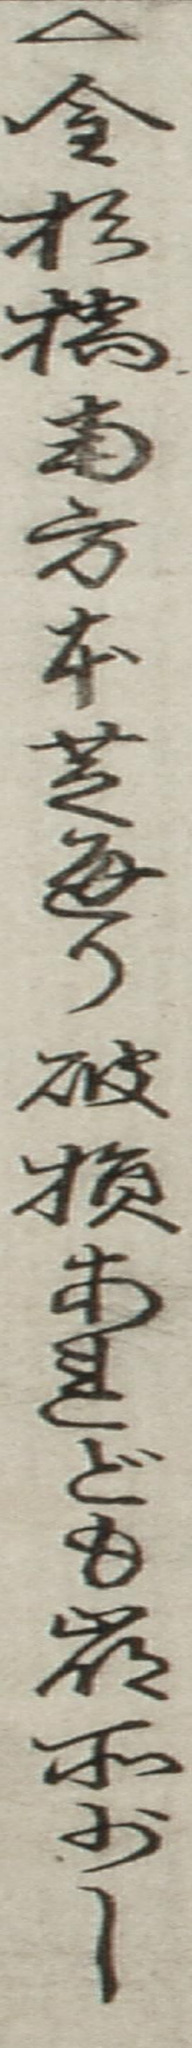△金杉橋南方本芝通り破損あれども崩所少し
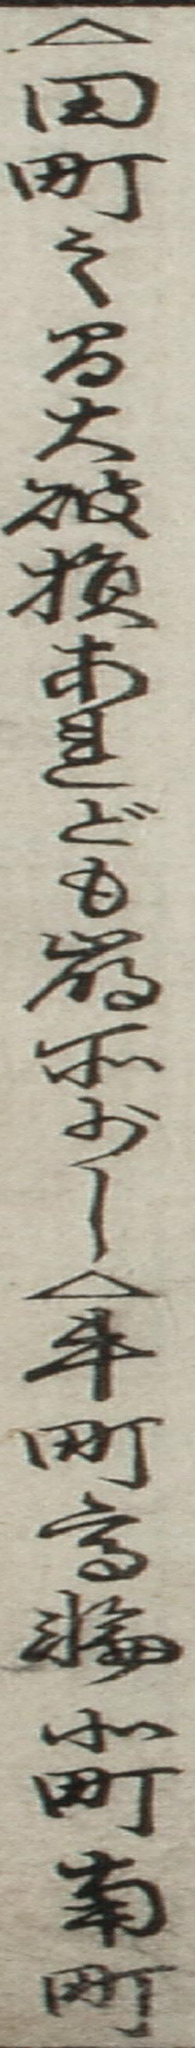△田町之間大破損あれども崩所少し△牛町高輪北町南町
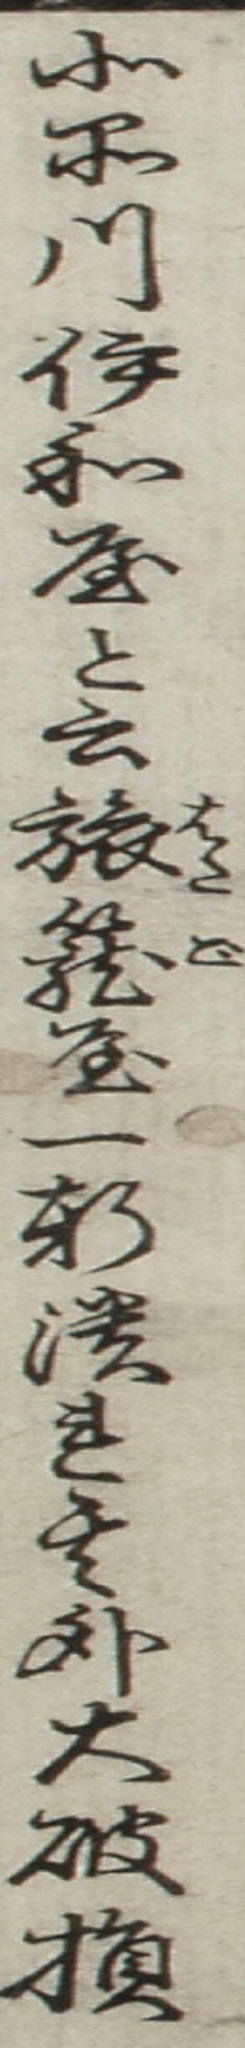北品川伊和屋と云旅籠屋一軒潰れ其外大破損
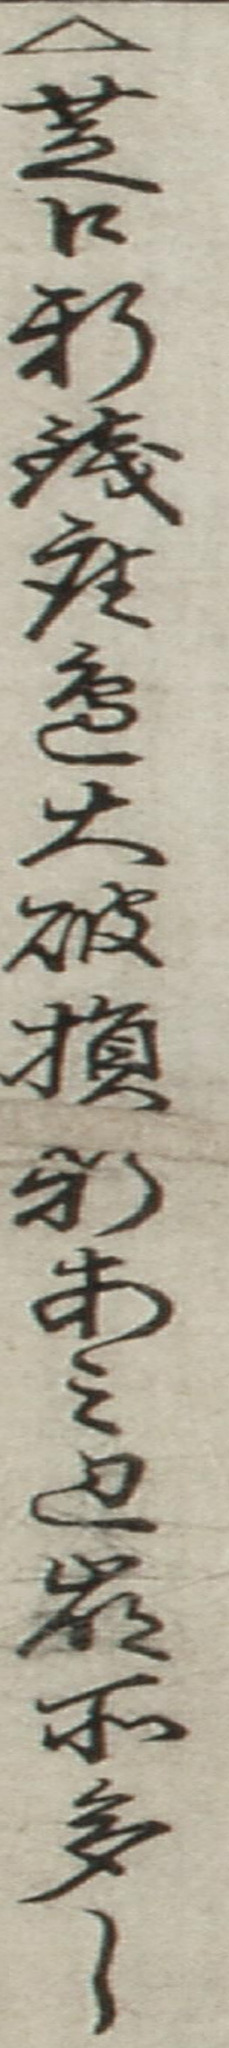△芝口新銭屋辺大破損新あみ辺崩所多し

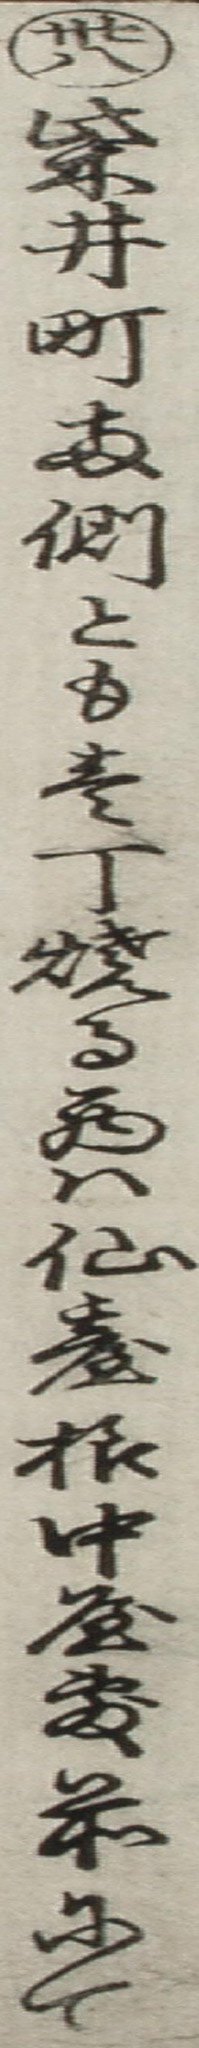柴井町両側とも壱丁焼る西は仙台様中屋敷前にて
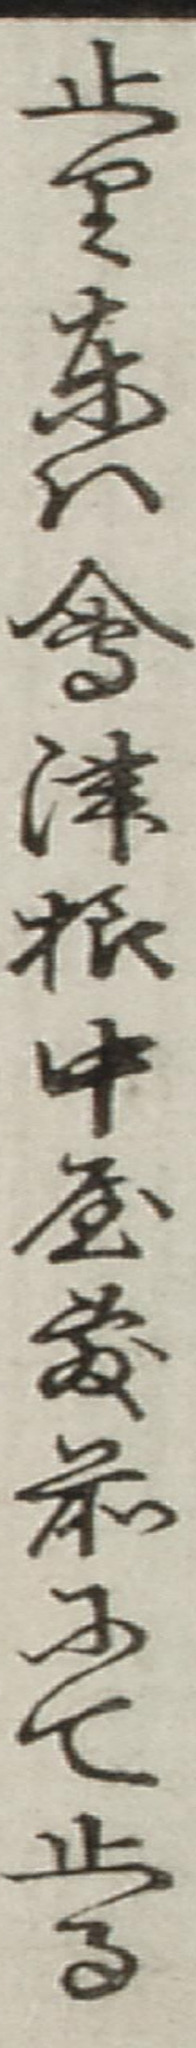止り東は会津様中屋敷前にて止る
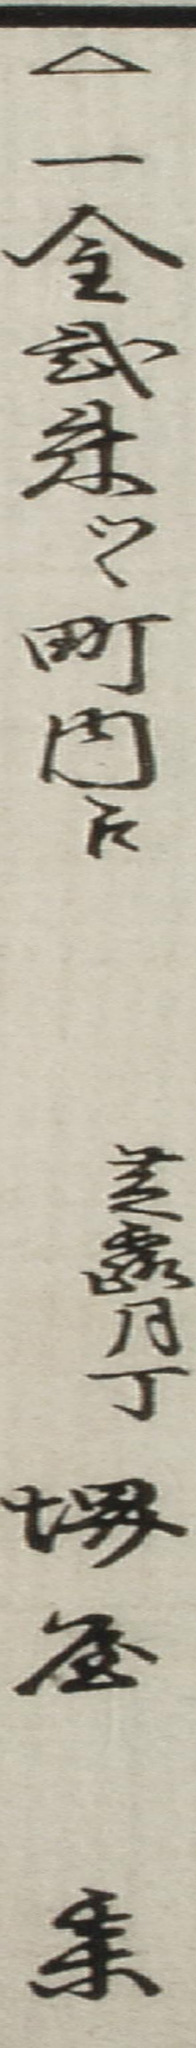△一金弐朱ツゝ町内江芝露月丁堺屋某
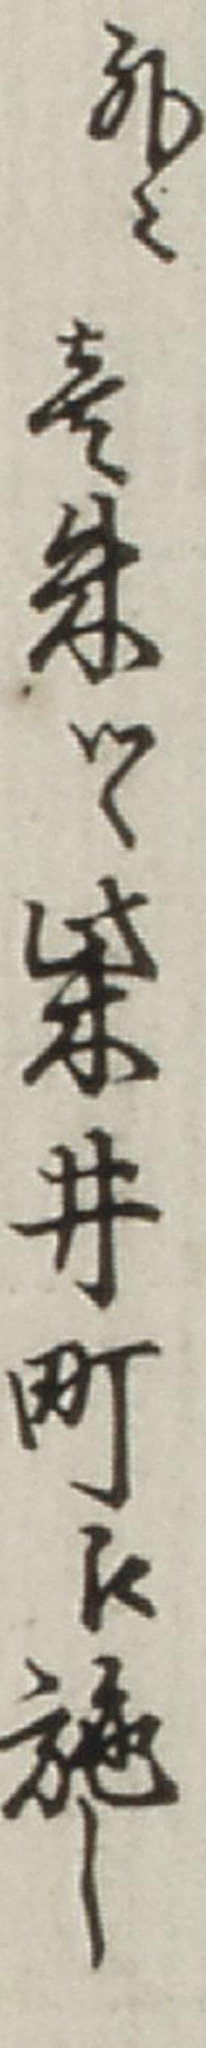外に壱朱ツゝ柴井町江施し
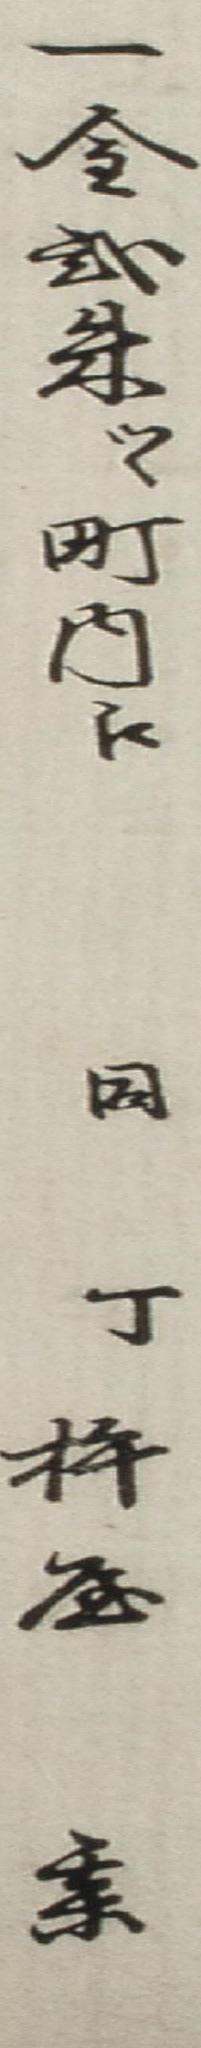一金弐朱ツゝ町内江同丁杵屋某
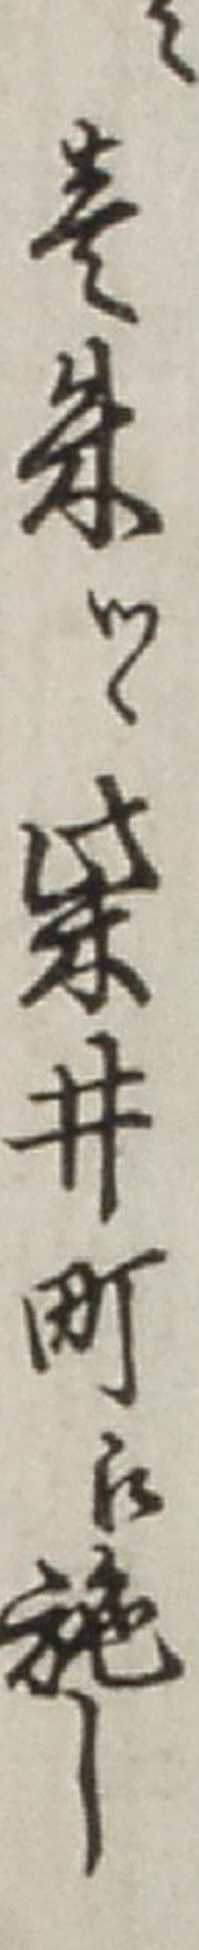外に壱朱ツゝ柴井町江施し
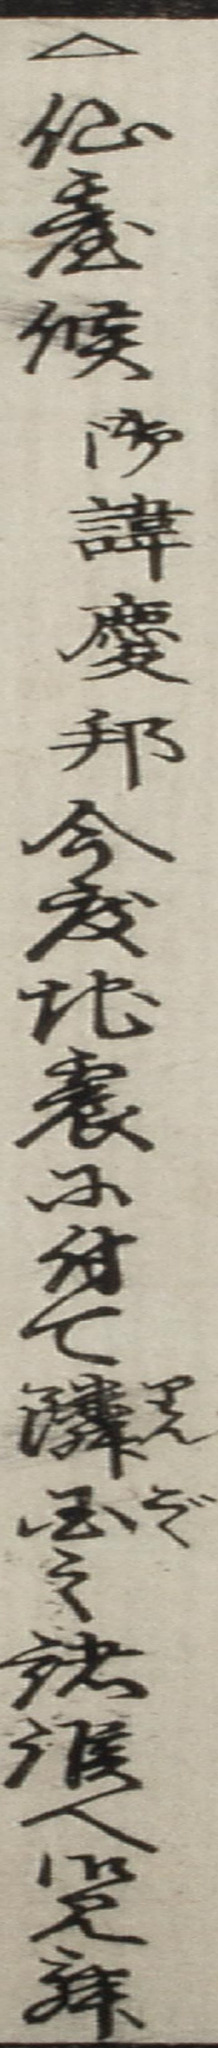△仙台侯御諱慶邦今度地震に付て隣国之緒侯へ御見舞
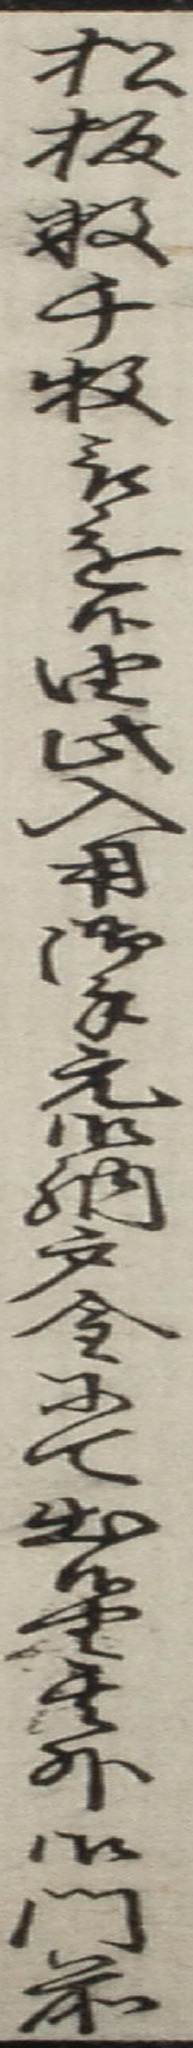松板数千枚被遣候由此入用御手元御納戸金にて出候由其外御門前
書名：安政見聞誌　下
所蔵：東京大学地震研究所図書室 Earthquake Research Institute Library, The University of Tokyo, JAPAN
